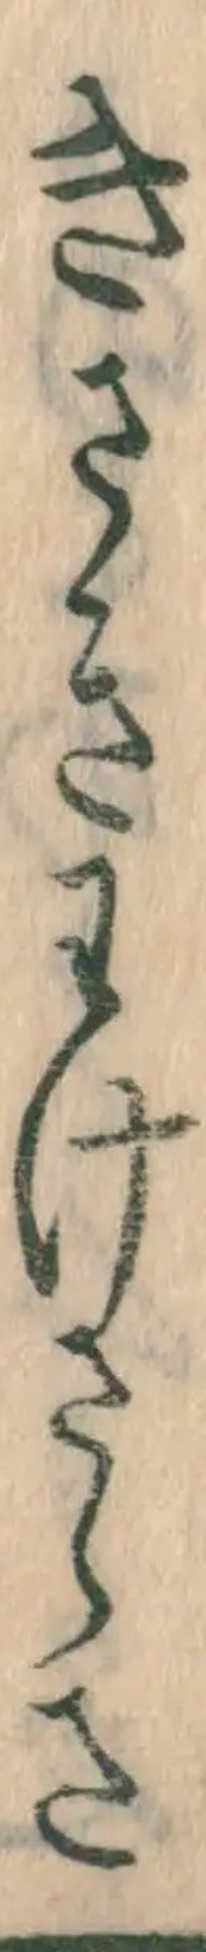きさきわけさらさ

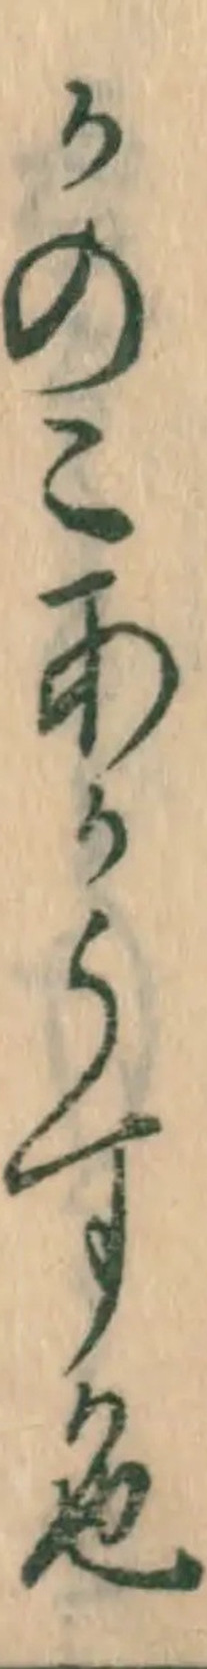かのこあかうす色
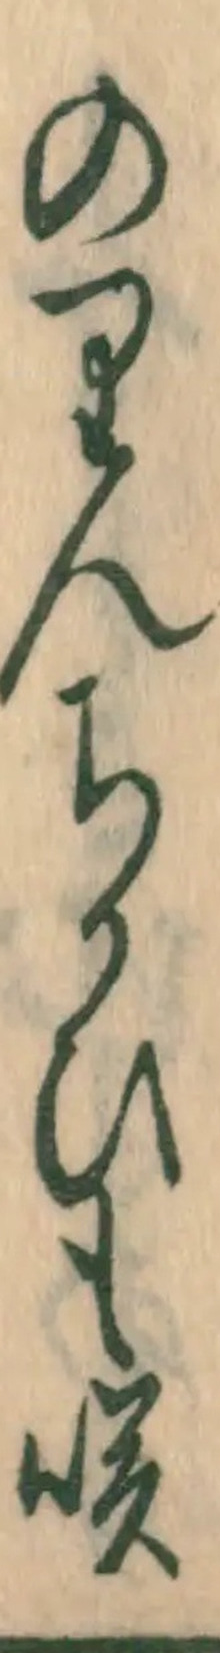のりんちかひも咲
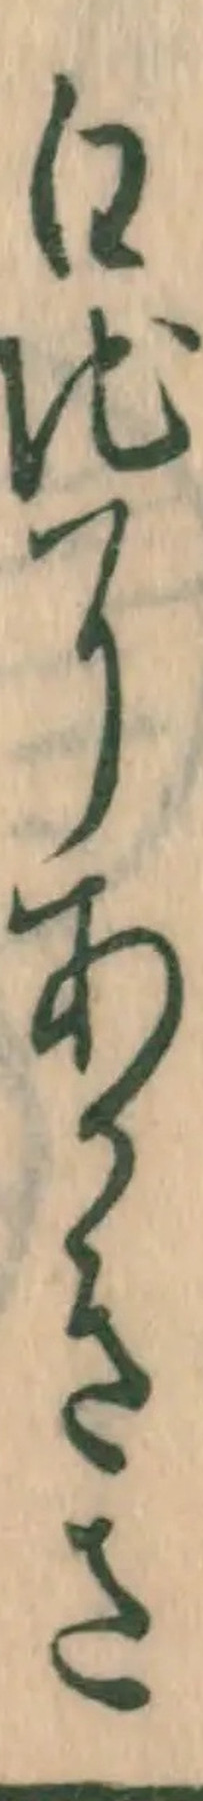白地にあかきさ
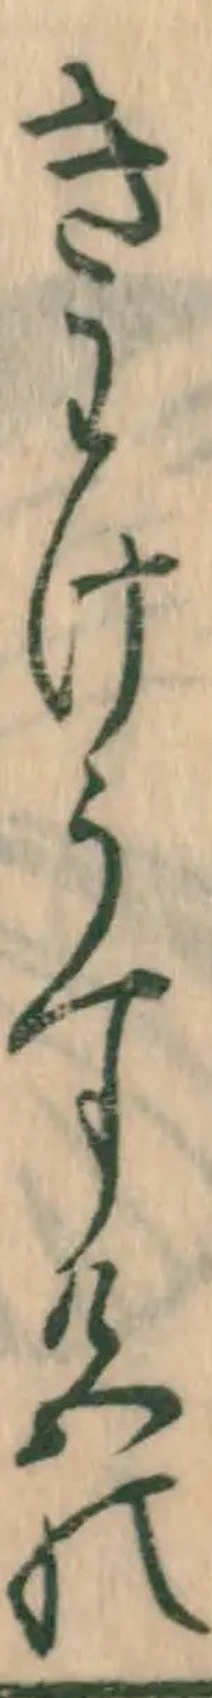きわけうす色の
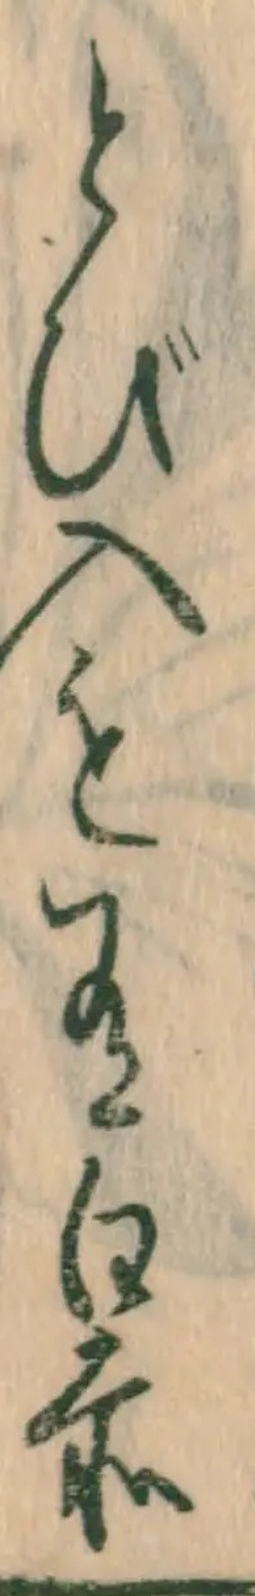とび入も有白赤
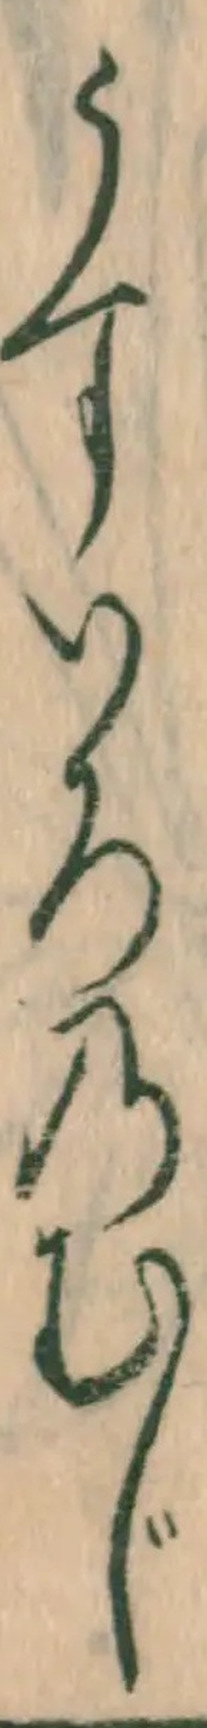うすいろのむじ
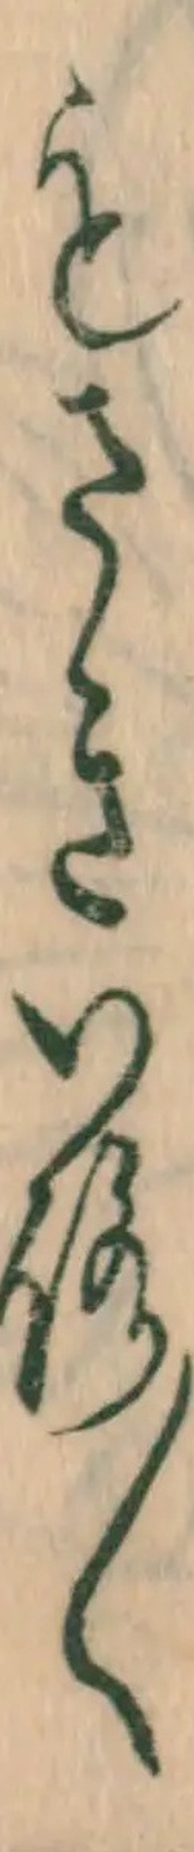もさきいろ〳〵
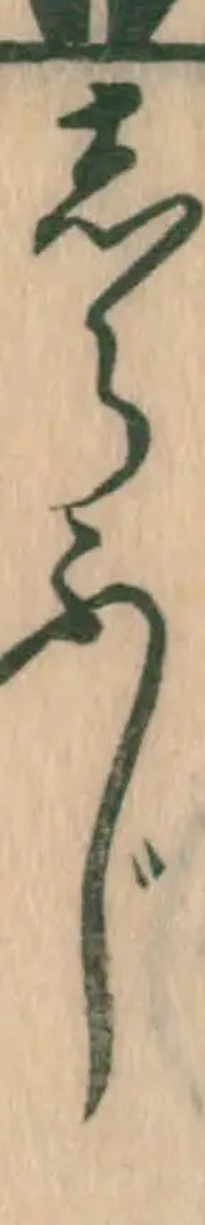しらふじ
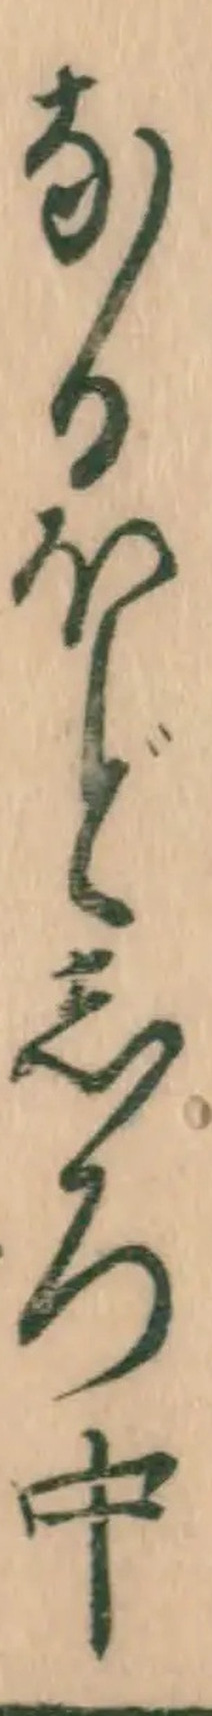なるほどしろ中
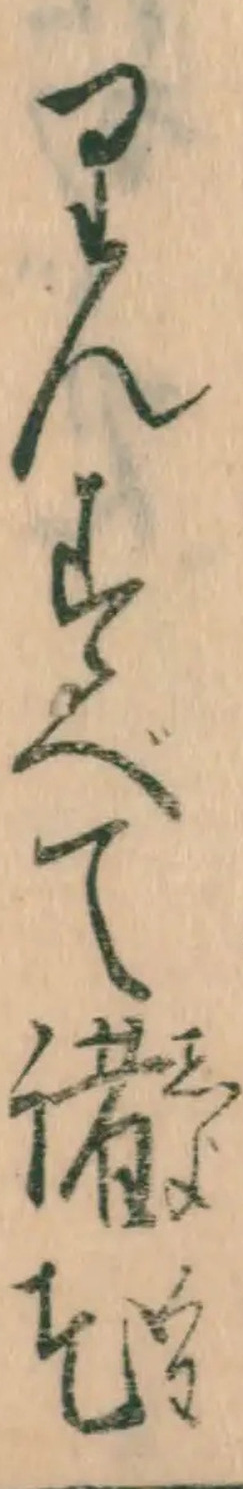りんすべて諸花
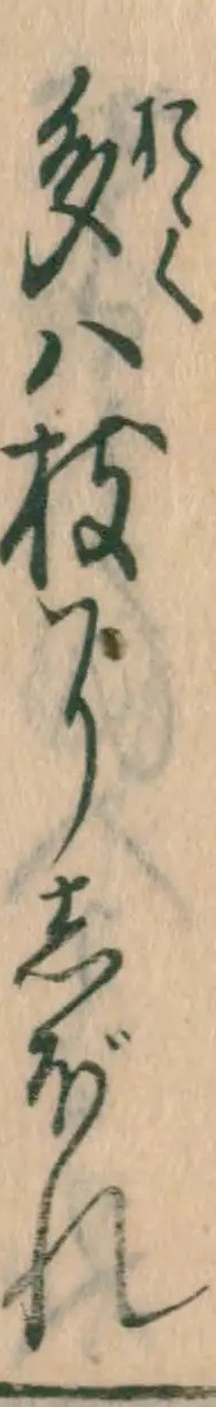多は枝にしぼれ
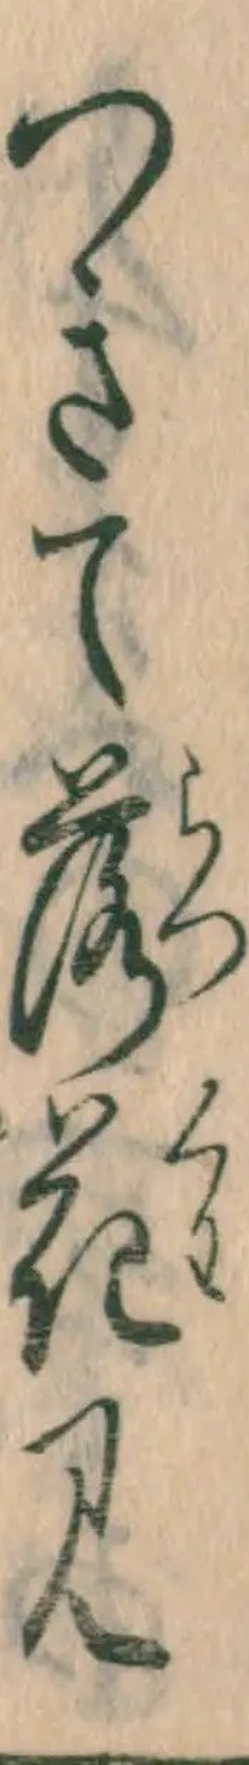つきて落花見
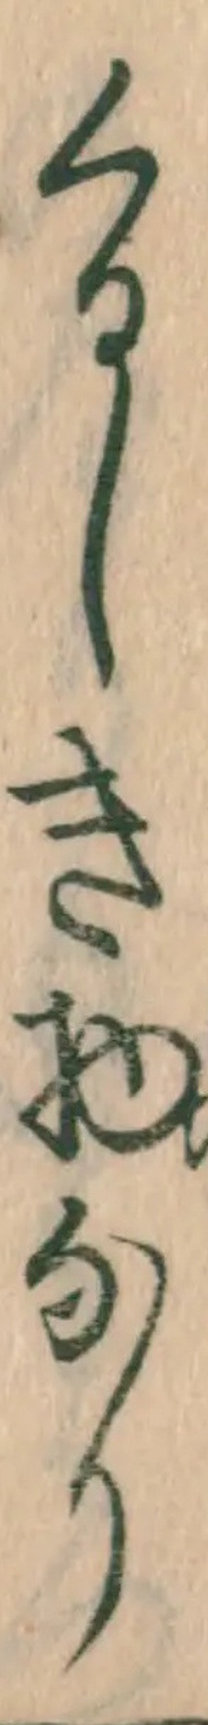くるしき物なり
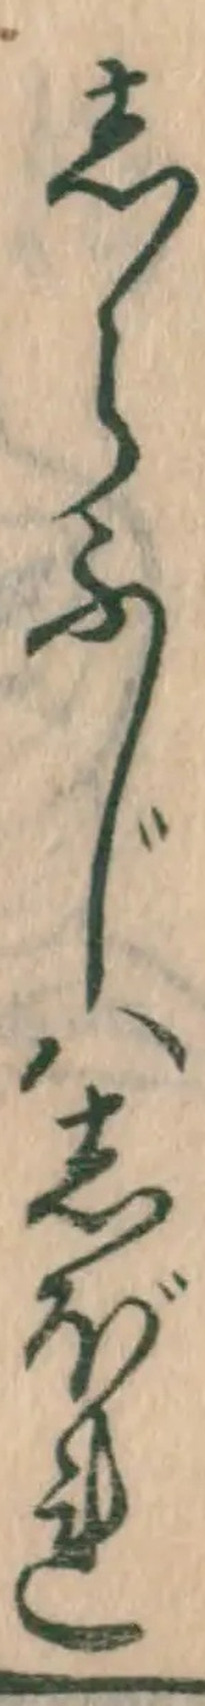しらふじはしぼれ
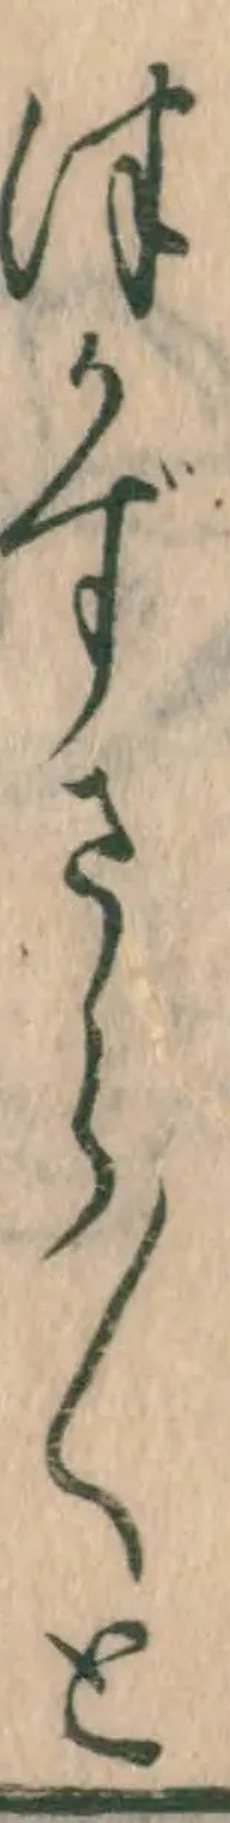付かずさら〳〵と
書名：錦繍枕 5巻. [4]
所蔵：国立国会図書館 National Diet Library, JAPAN
